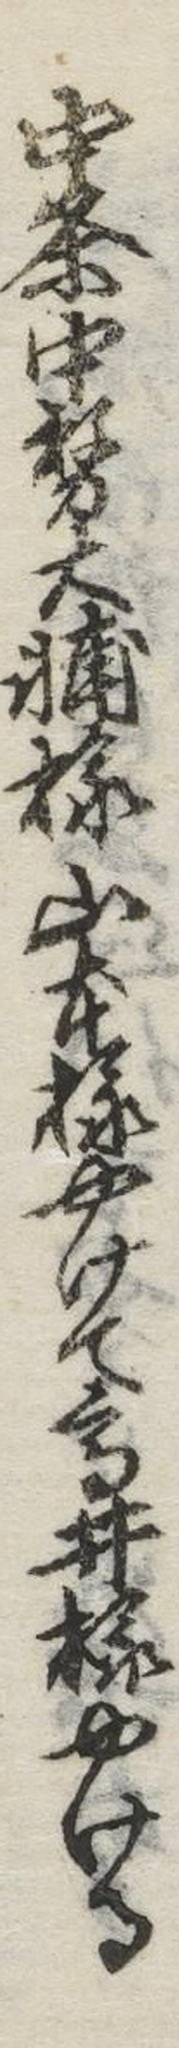中条中務大輔様山本様やけて高井様やける
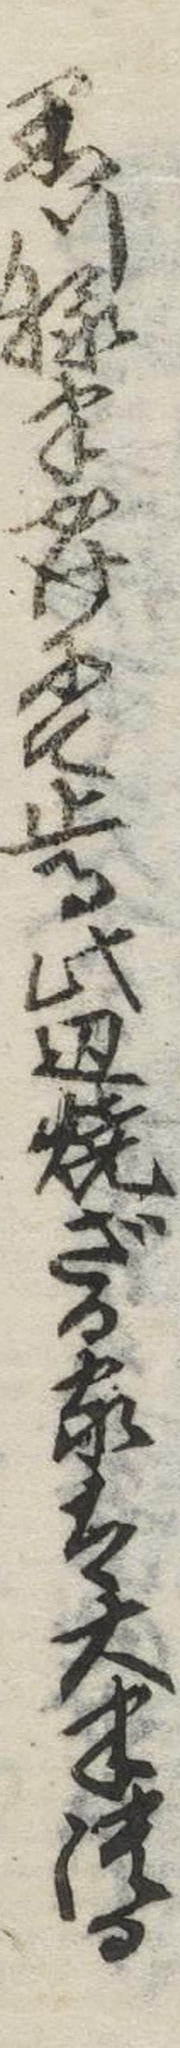黒川様半やけにて止る此辺焼ざる家は大半潰る
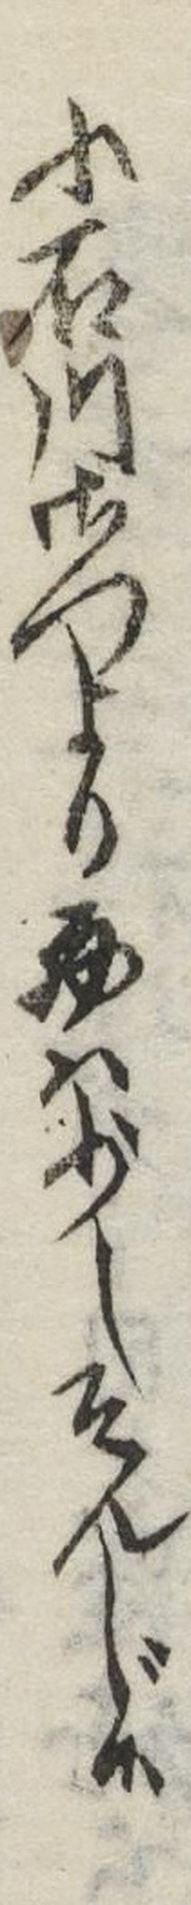小石川御門より西ハ少しそんじ候
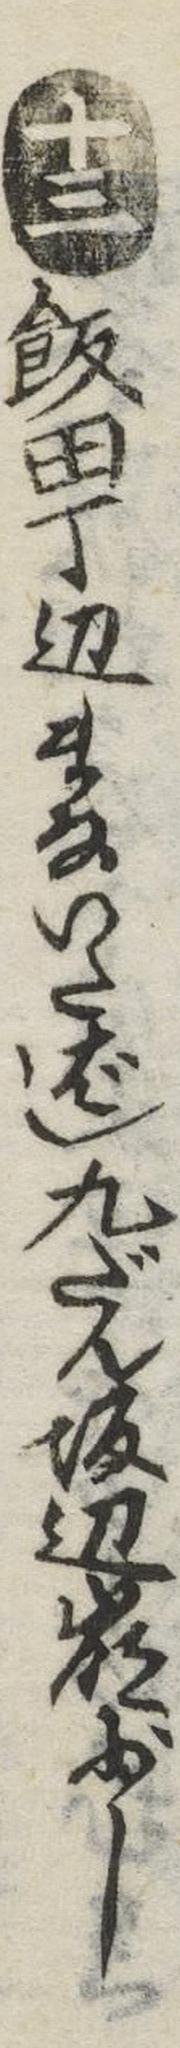十三飯田丁辺まないたばし九だん坂辺崩少し
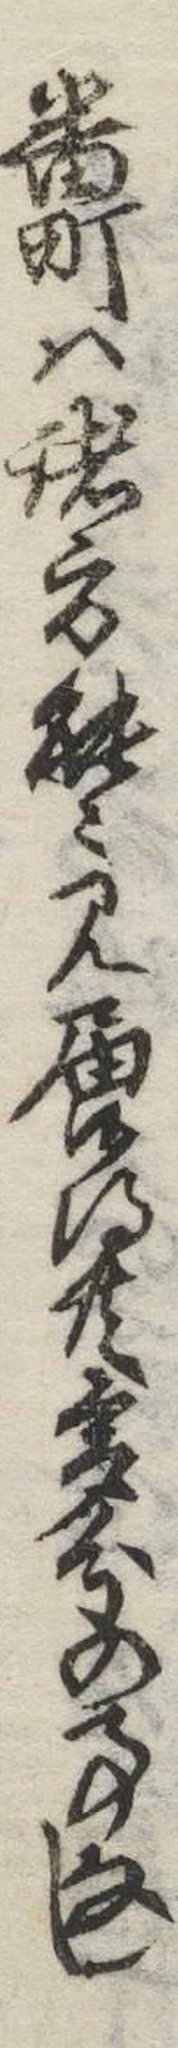番町ハ諸方能〻見届候得共多分の事なし
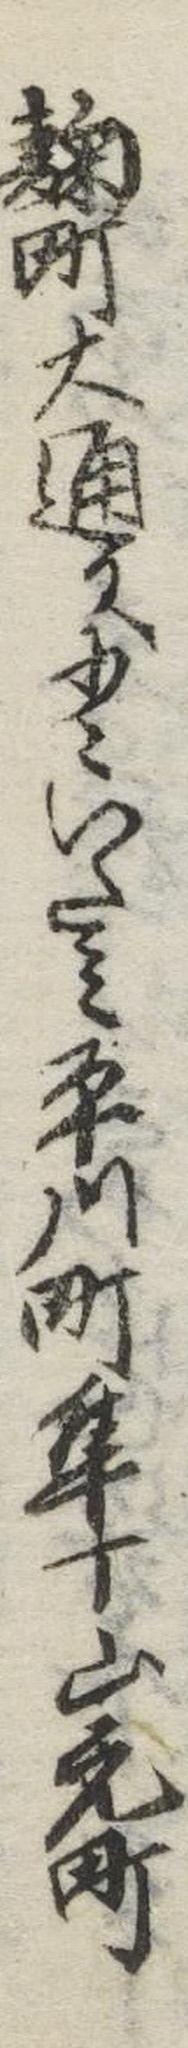麹町大通り少〻いたミ平川町隼丁山元町
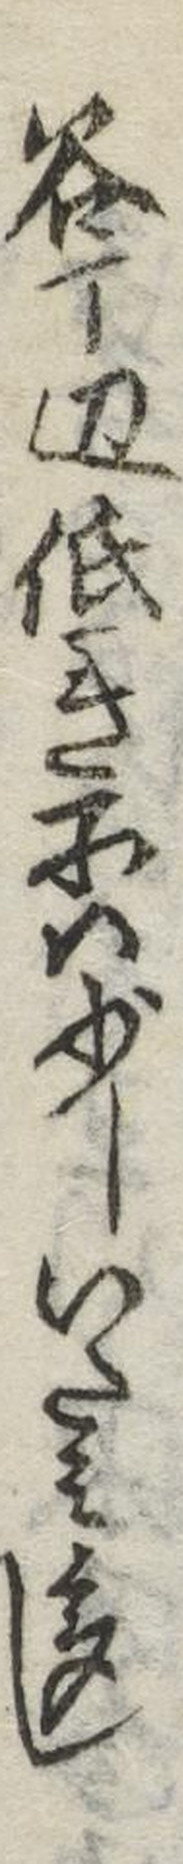谷丁辺低き所ハ少しいたミ多し
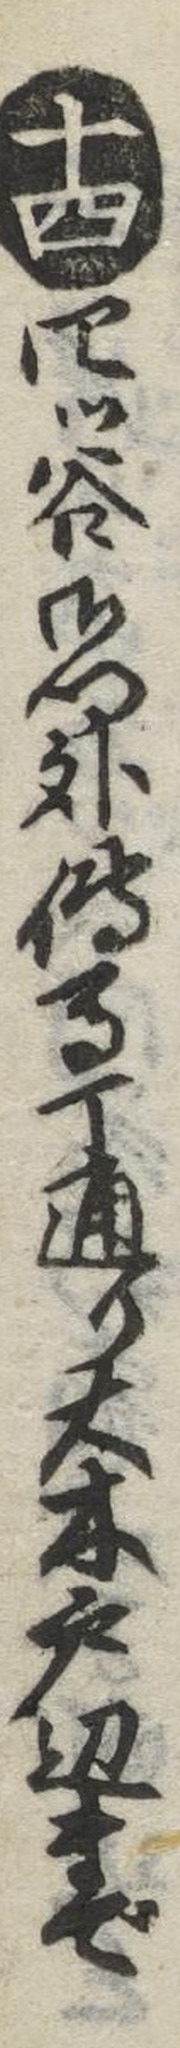十四四ツ谷御門外傳馬丁通り大木戸辺まで

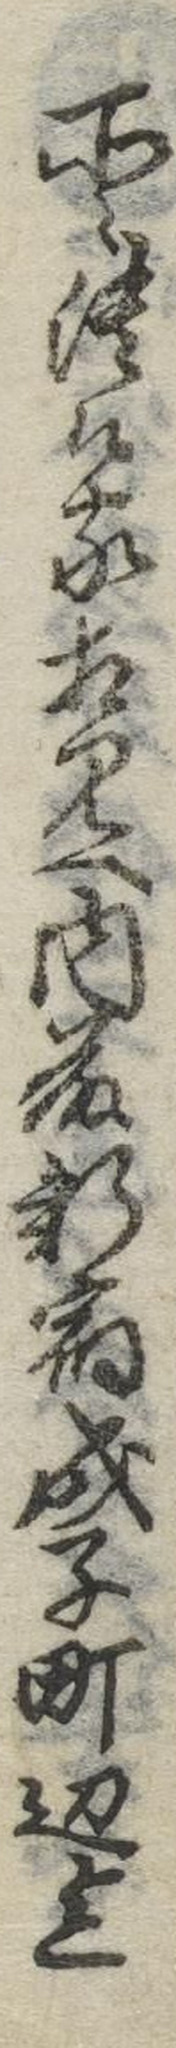所〻潰候家相見へ内藤新宿成子町辺迄
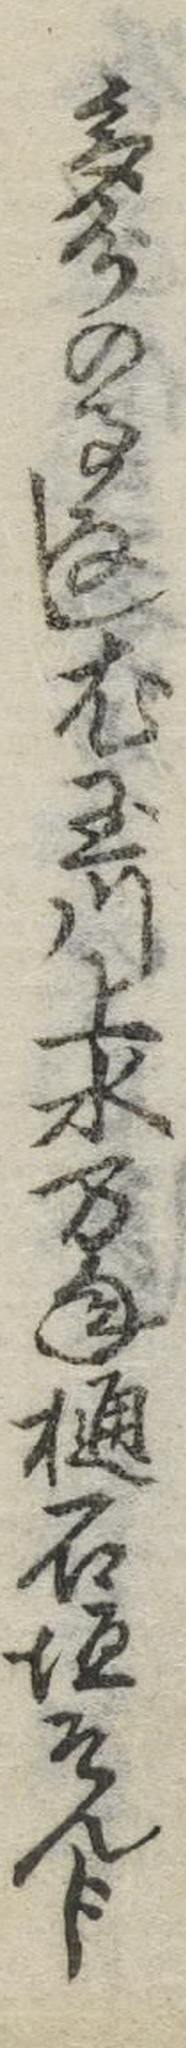多分の事なし尤玉川上水万年樋石垣そんじ
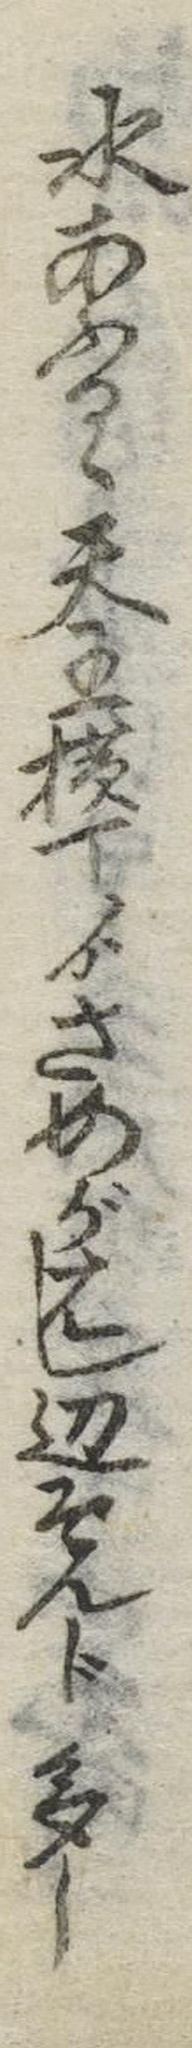水あふるゝ天王横丁ゟさめがはし辺そんじ多し
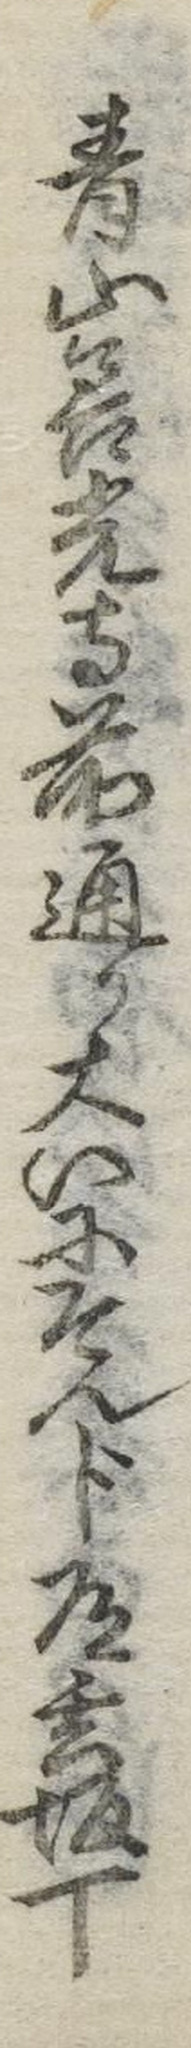青山善光寺前通り大いにそんじ道玄坂丁
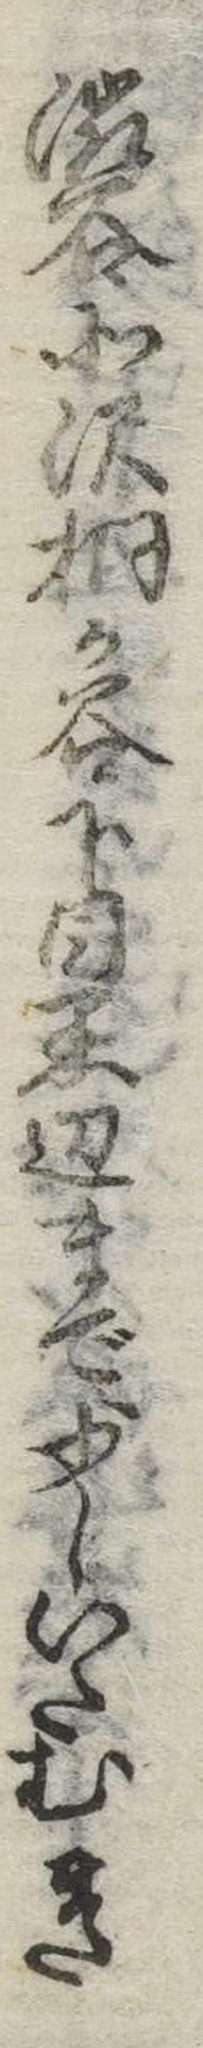渋谷北沢桐ケ谷下目黒辺まで少しいたむまた
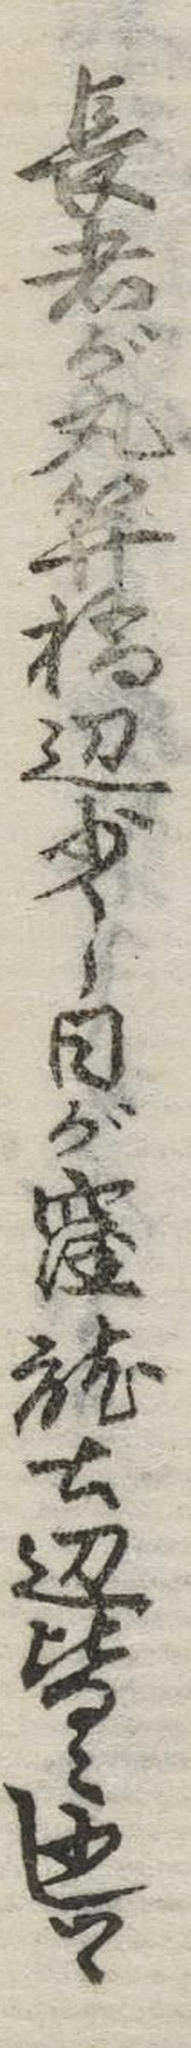長者が丸笄橋辺少し日が窪龍土辺皆〻少しツヽ
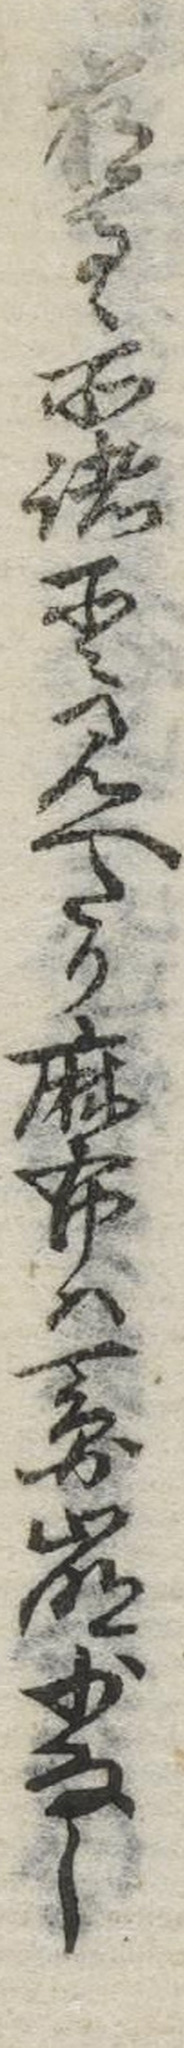崩るゝ所諸所ニ見へたり麻布は一円崩少なし
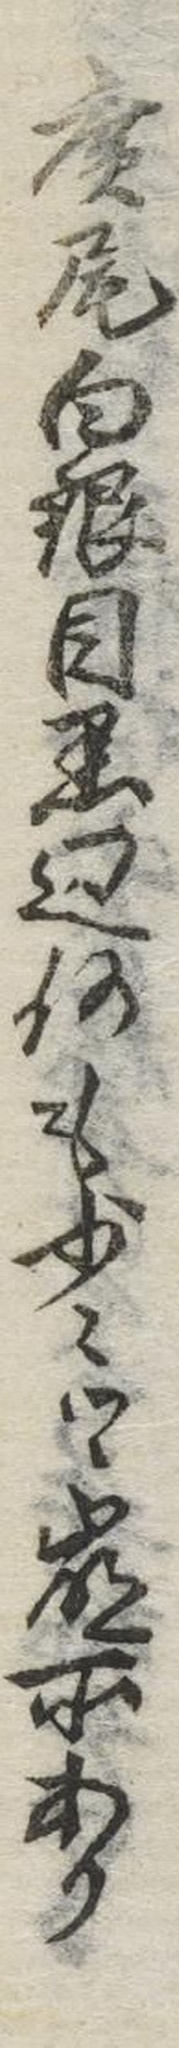廣尾白銀目黒辺何も少々ツヽ崩所あり
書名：江戸御屋鋪方町方共　地震類焼場所巨細書之寫　潰家潰土蔵共取調附街道筋近在迄
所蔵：東京大学地震研究所図書室 Earthquake Research Institute Library, The University of Tokyo, JAPAN
